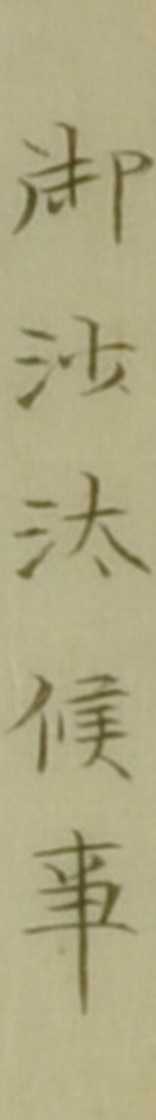御沙汰候事
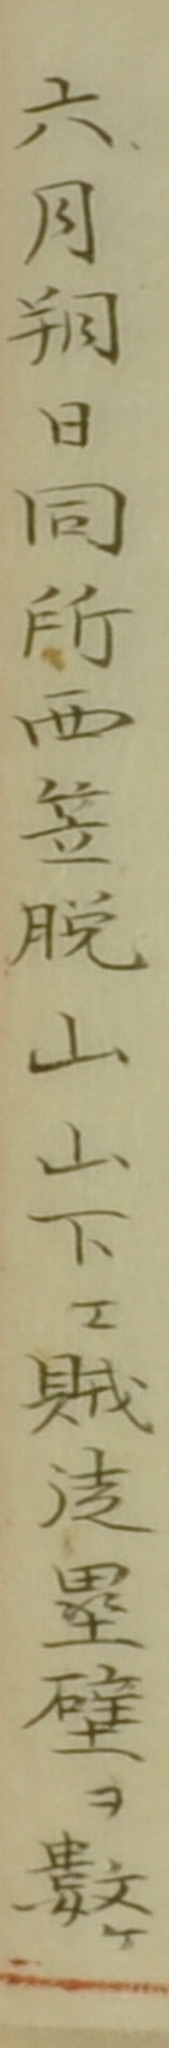六月朔日同所西笠脱山山下エ賊徒塁壁ヲ数ヶ
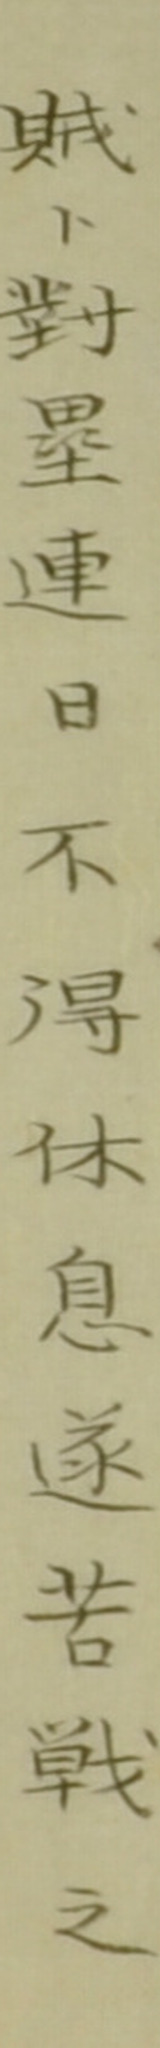賊ト対塁連日不得休息遂苦戦之

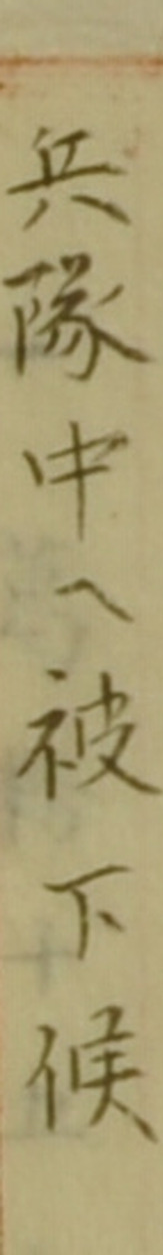兵隊中ヘ被下候
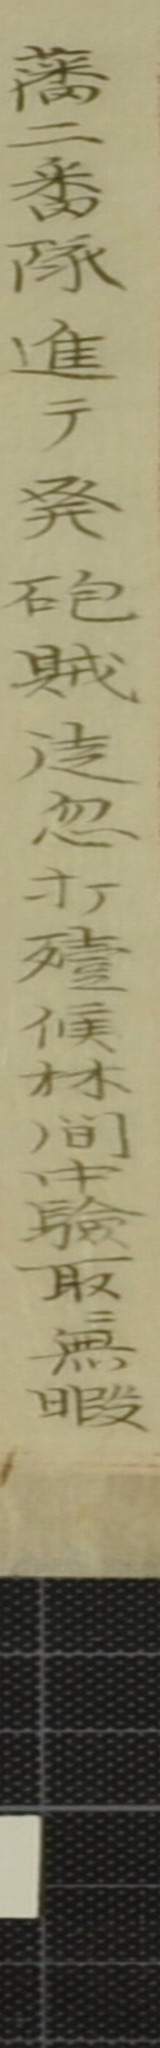藩二番隊進テ発砲賊徒忽打殪候林間中験取ニ無暇
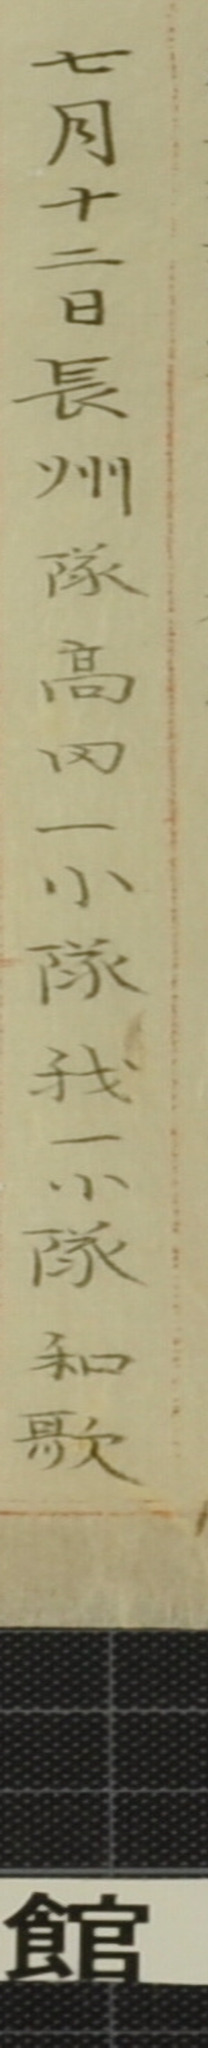七月十二日長州隊髙田一小隊我一小隊和歌

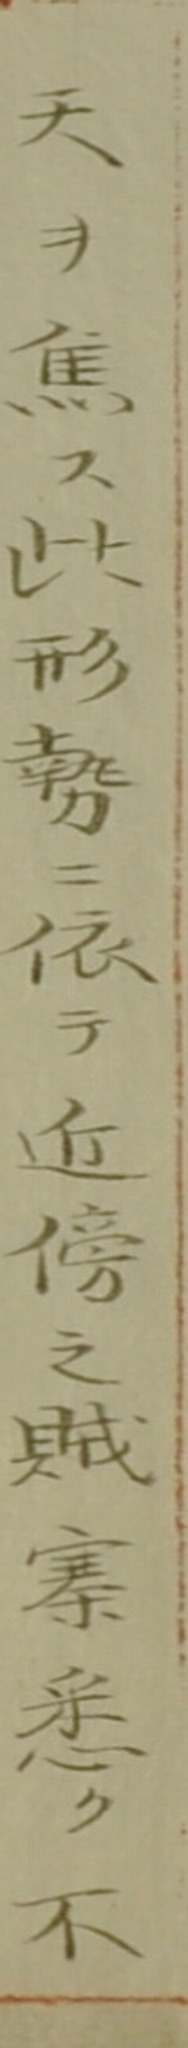天ヲ焦ス此形勢ニ依テ近傍之賊寨悉ク不
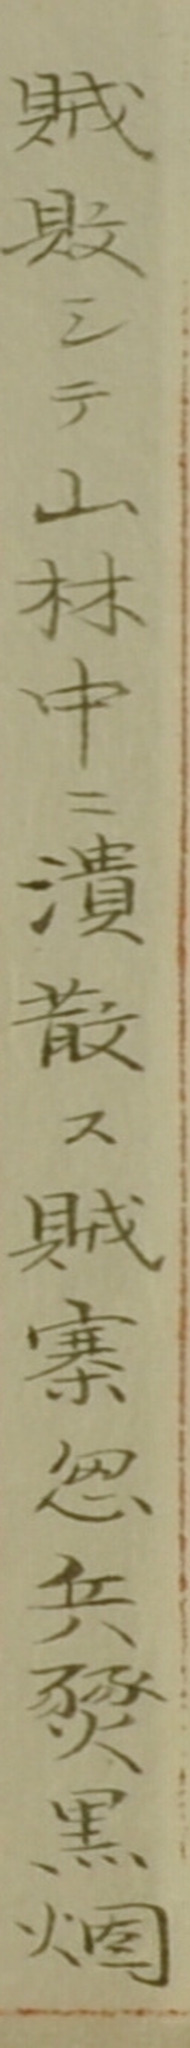賊敗シテ山林中ニ潰散ス賊寨忽兵燹黒烟

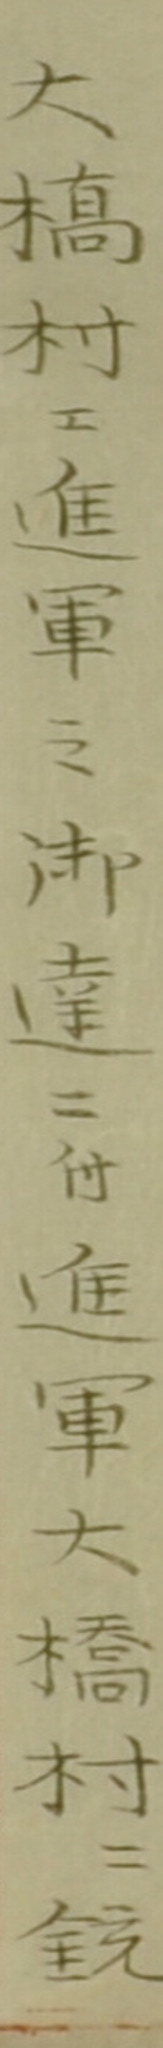大橋村エ進軍之御達ニ付進軍大橋村ニ銃
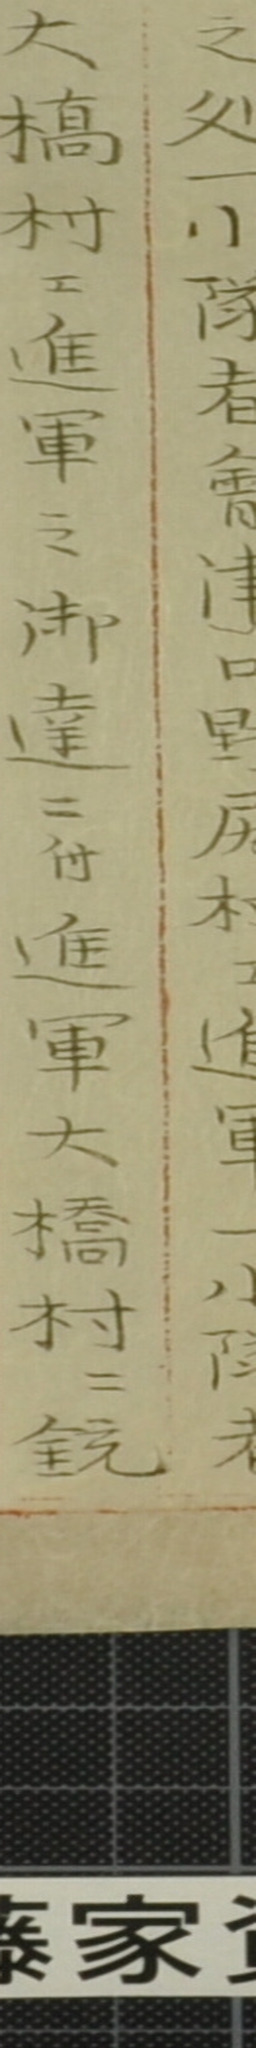大橋村エ進軍之御達ニ付進軍大橋村ニ銃
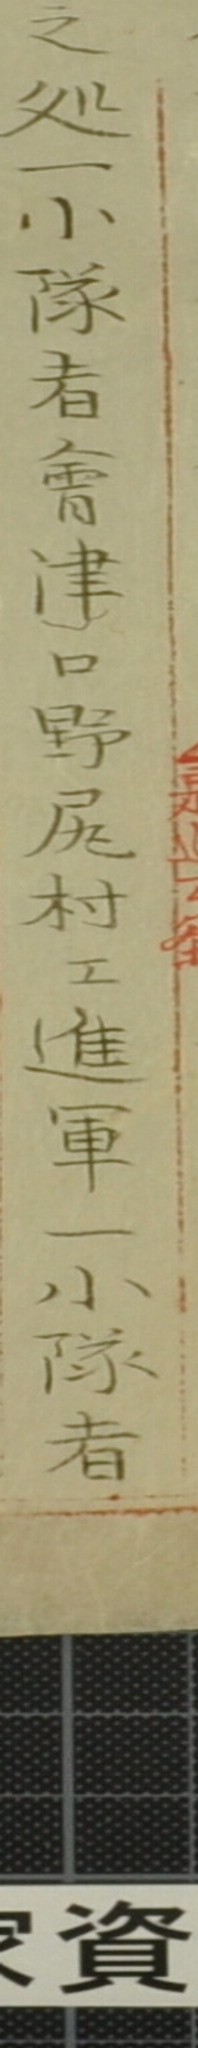之処一小隊者会津口野尻村エ進軍一小隊者
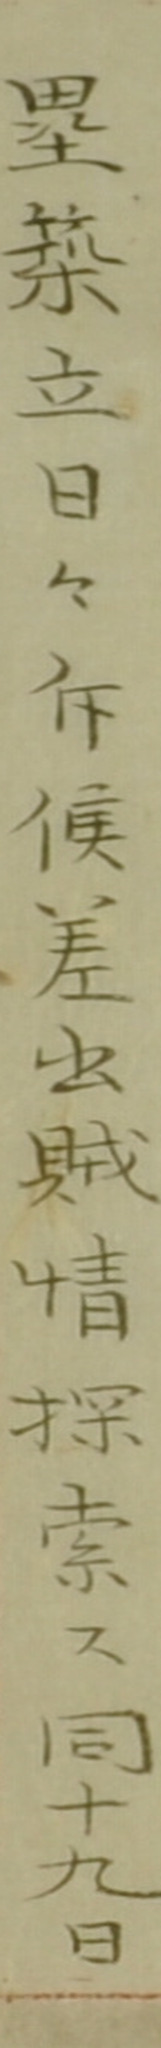塁築立日々斥候差出賊情探索ス同十九日
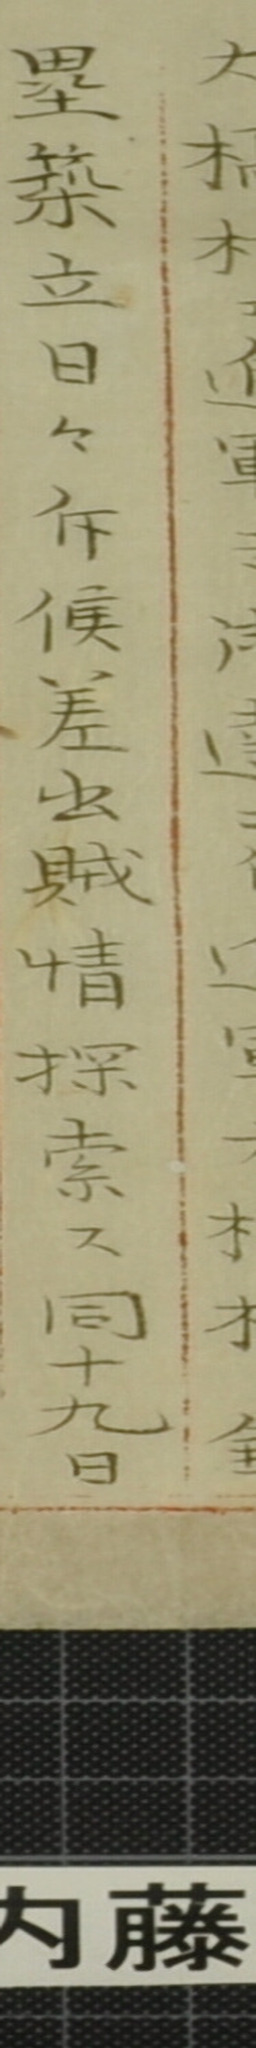塁築立日々斥候差出賊情探索ス同十九日
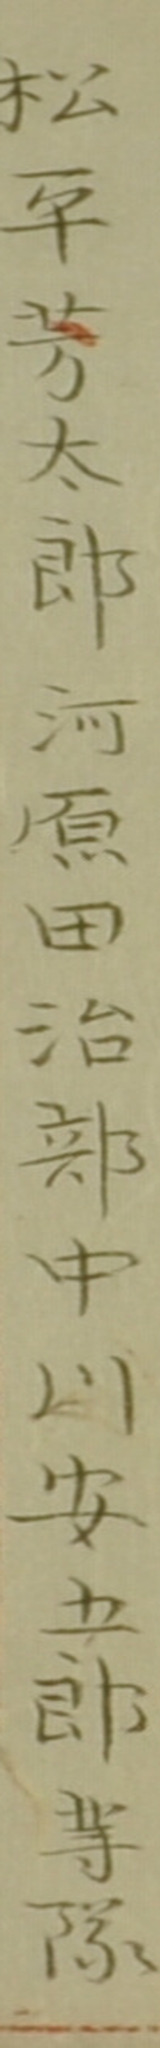松平芳太郎河原田治部中川安五郎等隊
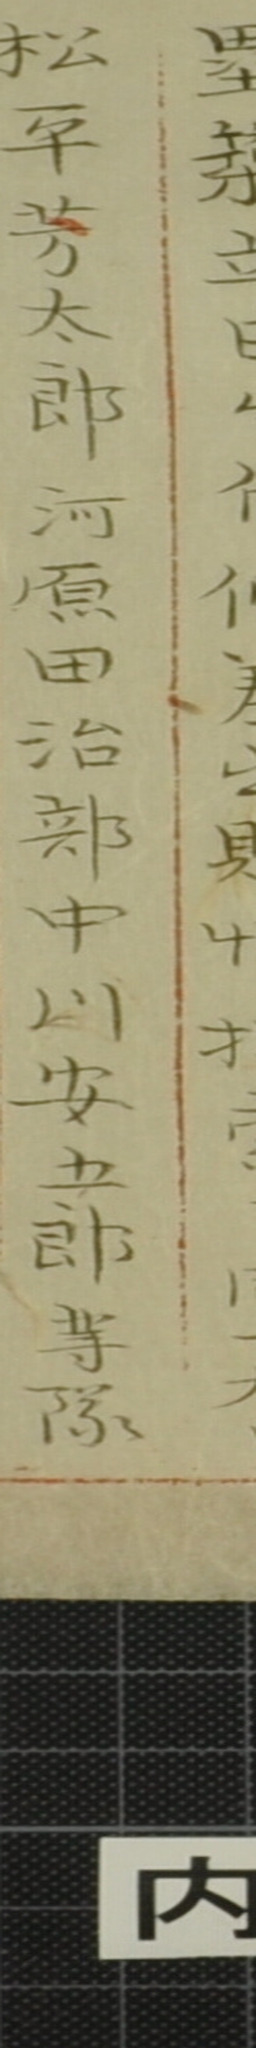松平芳太郎河原田治部中川安五郎等隊
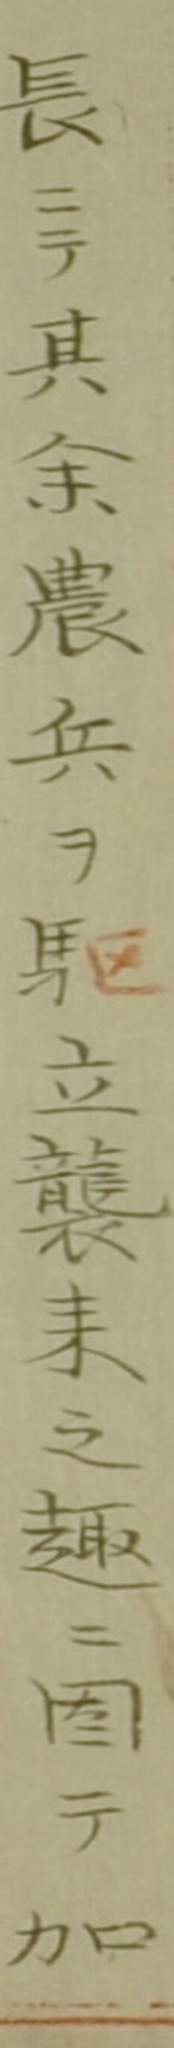長ニテ其余農兵をヲ駆立襲来之趣ニ因テ加
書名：奥越出兵中戦争之事件概略抄録（控）
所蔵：伊那市立高遠町図書館・合同会社AMANE
